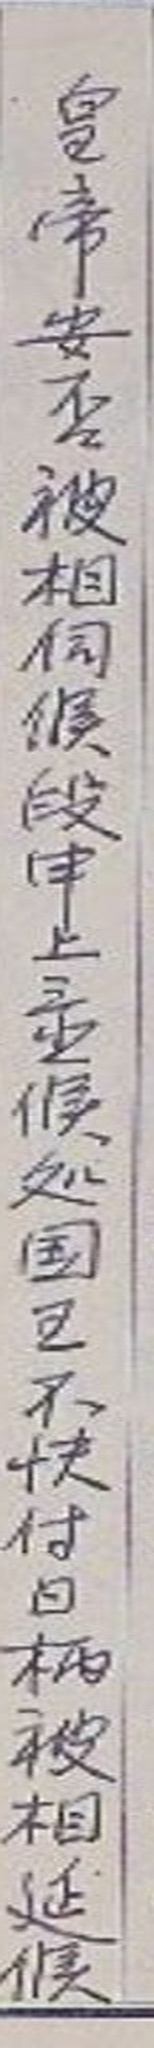皇帝安否被相伺候段申上置候処国王不快付日柄被相延候
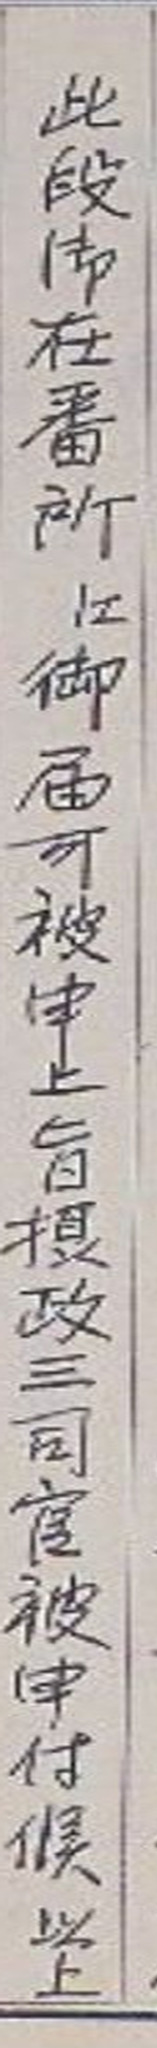此段御在番所え御届可被申上旨摂政三司官被申付候以上
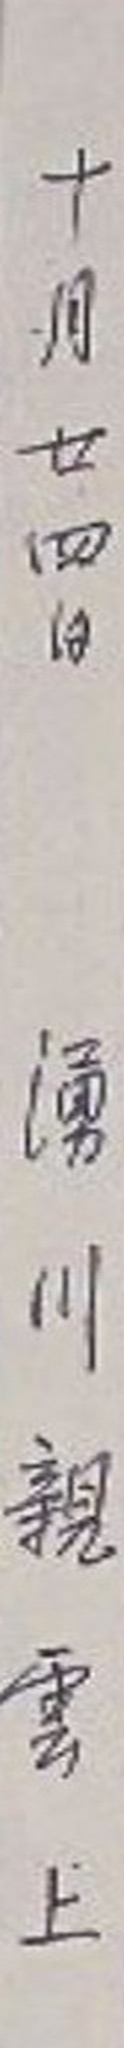十月廿四日湧川親雲上
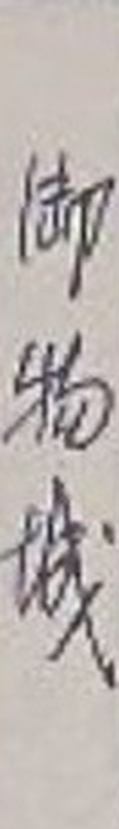御物城
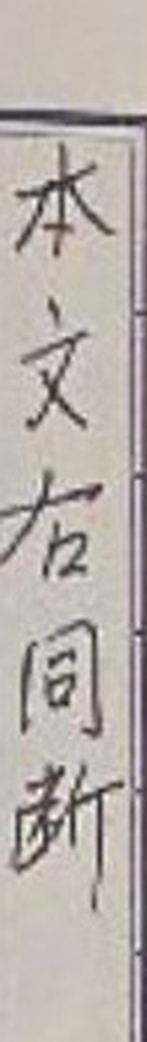本文右同断
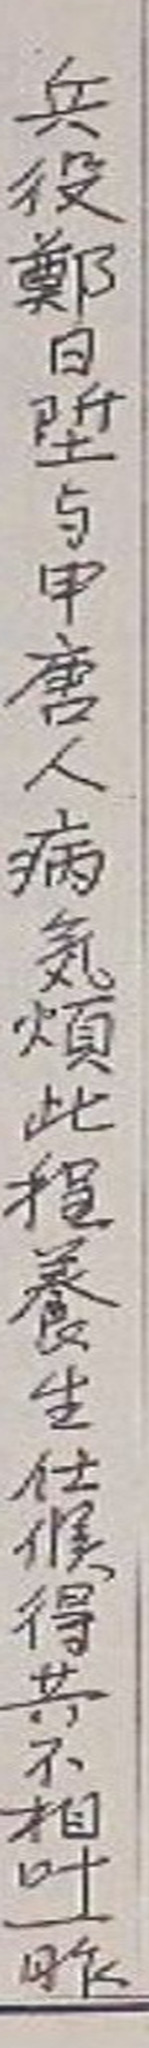兵役鄭日陞と申唐人病気煩此程養生仕候得共不相叶一昨
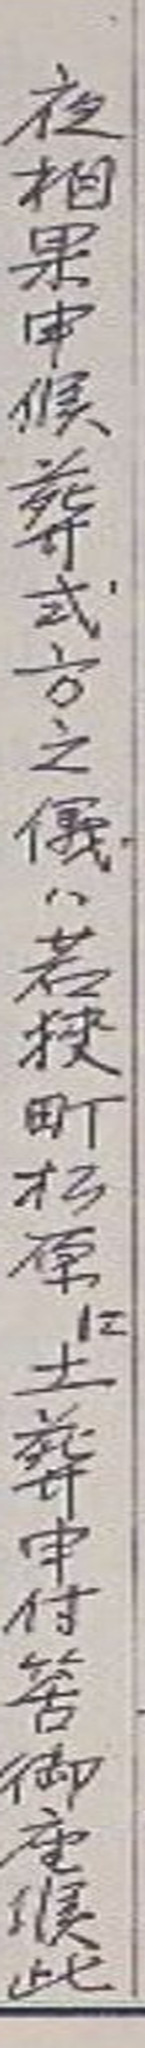夜相果申候葬式方之儀は若狭町松原え土葬申付筈御座候此
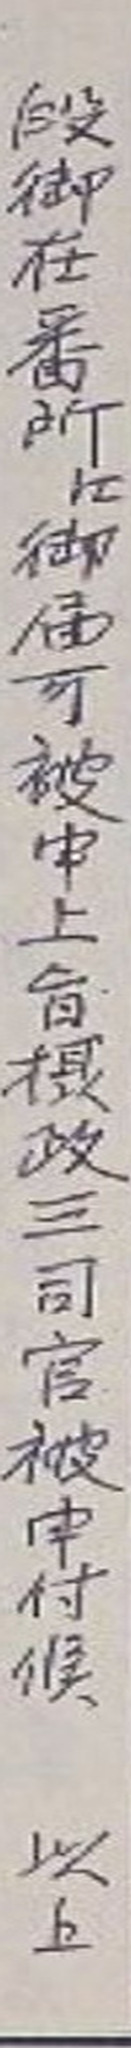段御在番所え御届可被申上旨摂政三司官被申付候以上
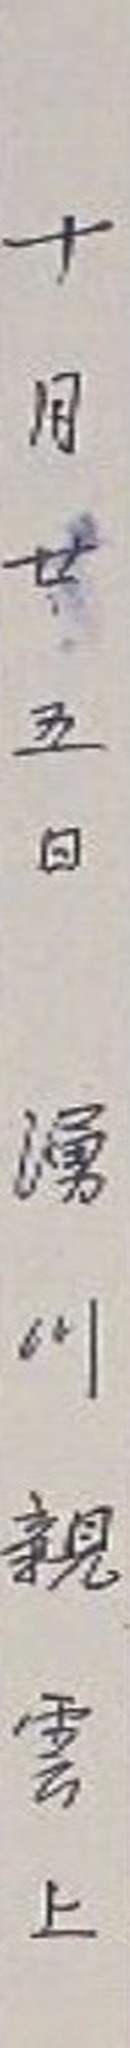十月廿日湧川親雲上
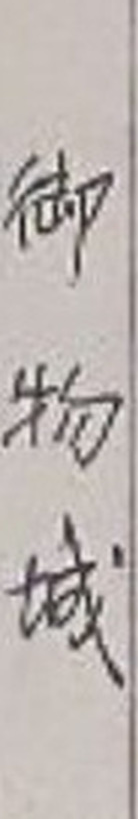御物城
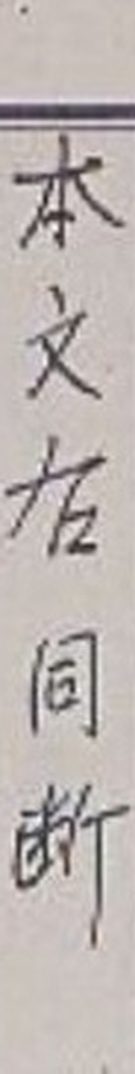本文右同断
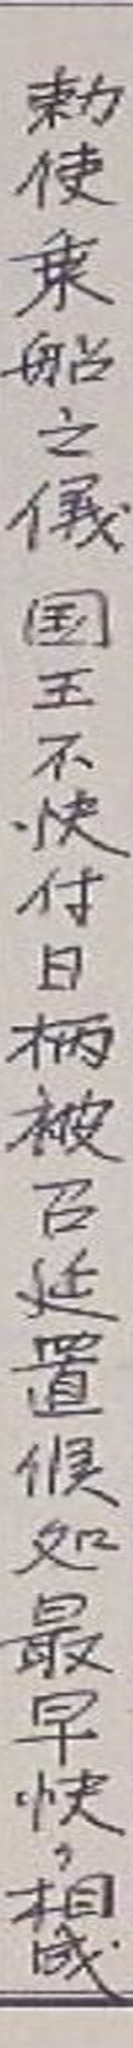勅使乗船之儀国王不快付日柄被召延置候処最早快く相成
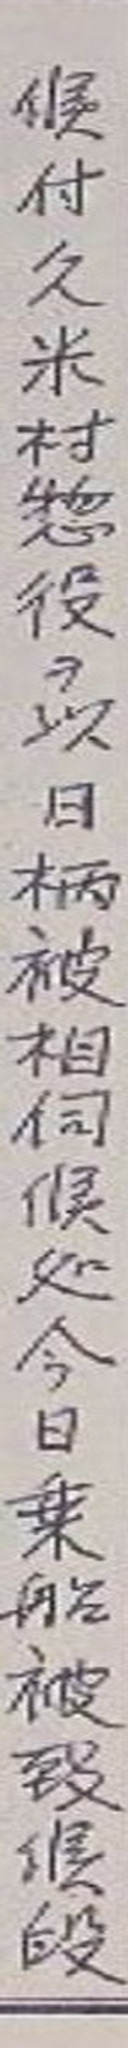候付久米村惣役を以日柄被相伺候処今日乗船被致候段
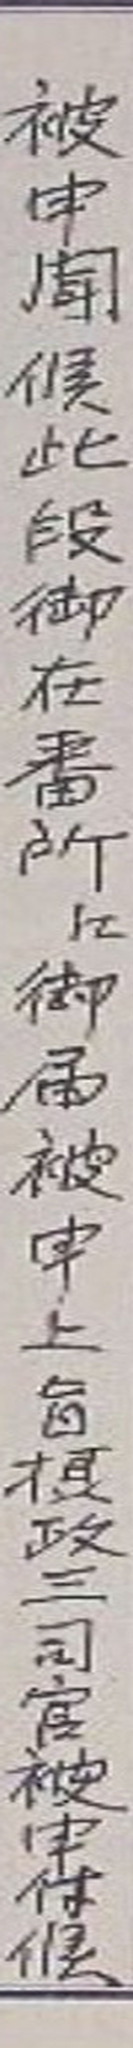被申聞候此段御在番所え御届可被申上旨摂政三司官被申付候
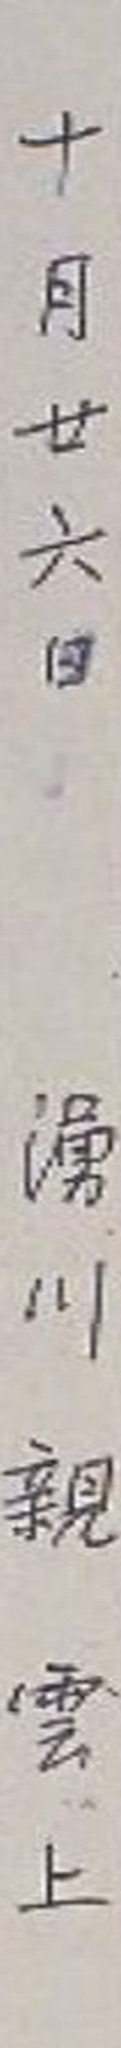十月廿六日湧川親雲上

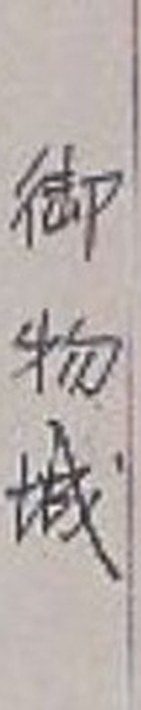御物城
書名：支那冊封使来琉諸記 下巻
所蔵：University of the Ryukyus Library
